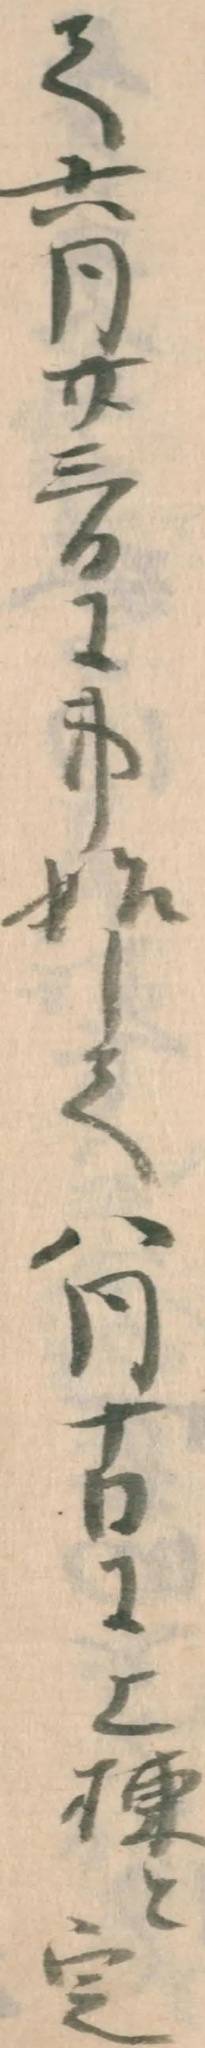て六月廿三日に事始して八月十日に上棟と定
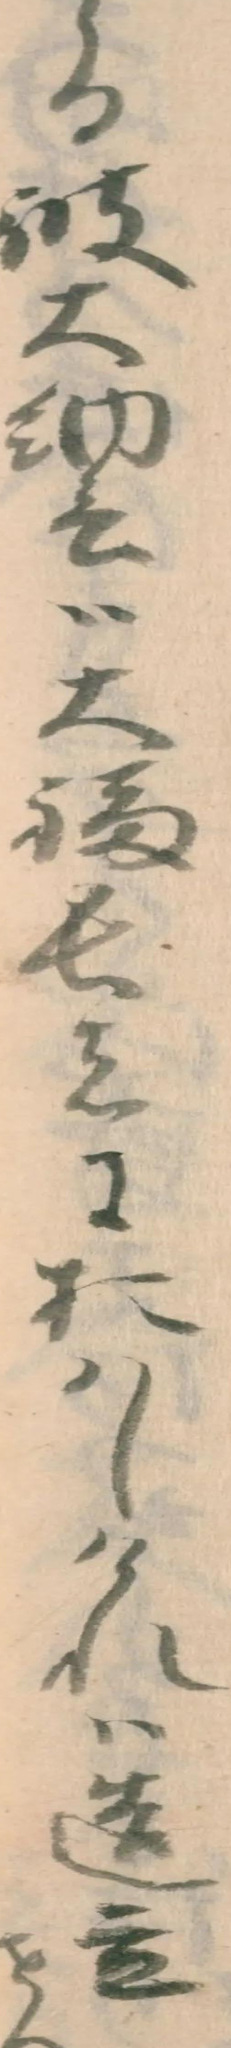らる彼大納言は大福長者におはしけれは造立せん
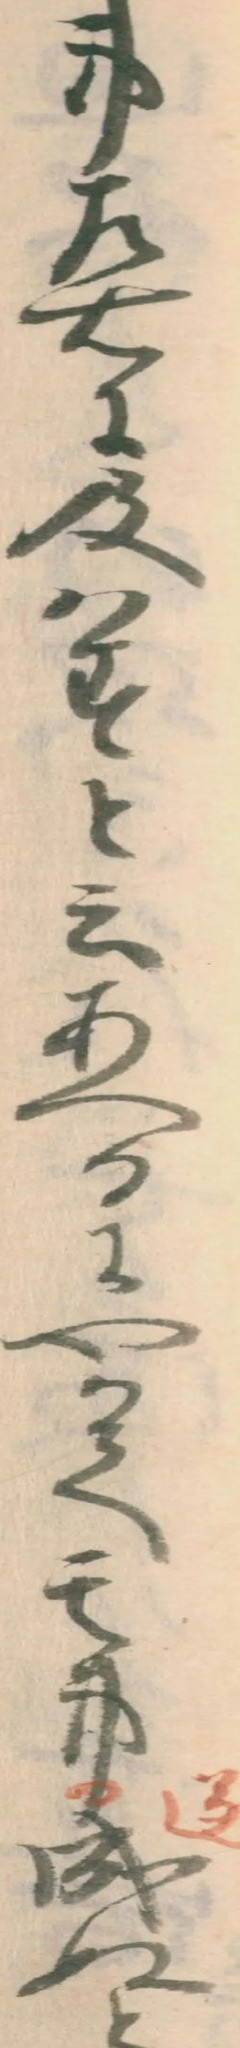事左右に及はすと云あへるにやかて其事◦成ぬと
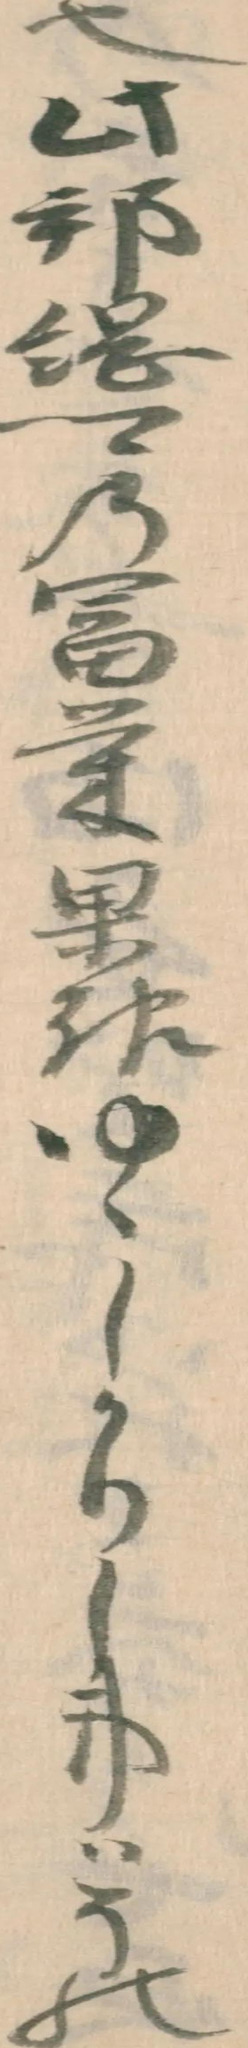也此邦綱卿の富栄果報ゆゝしかりし事はその
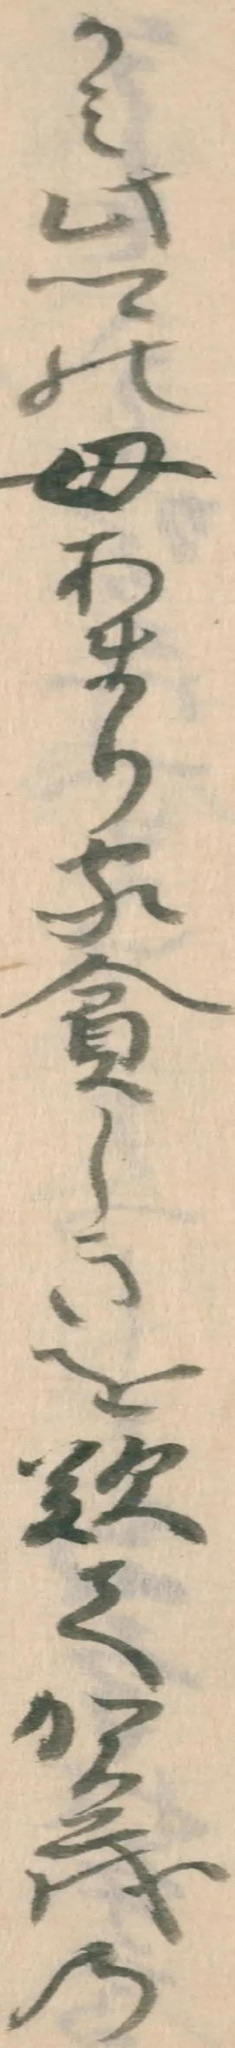かみ此卿の母あまり家貧しきを歎て賀茂の
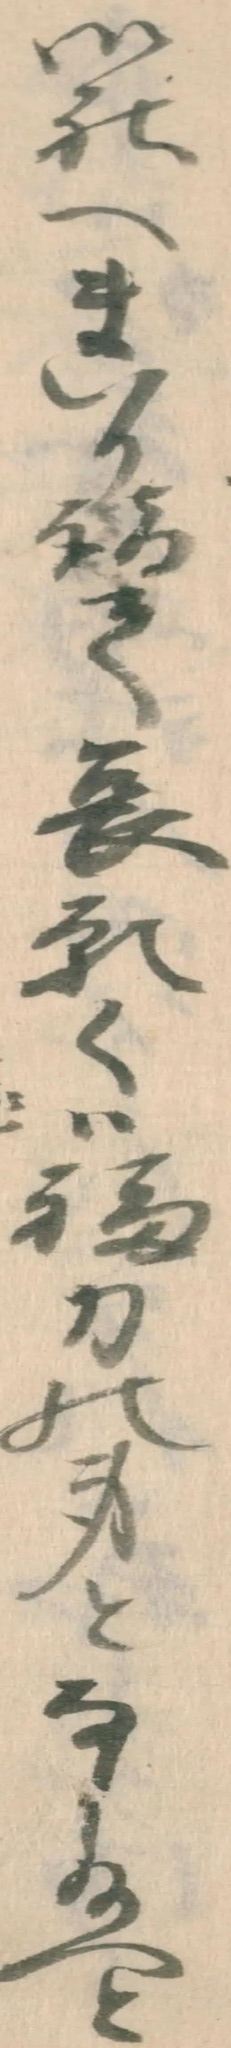御社へまいり詣て哀願くは福力の身となし給へと
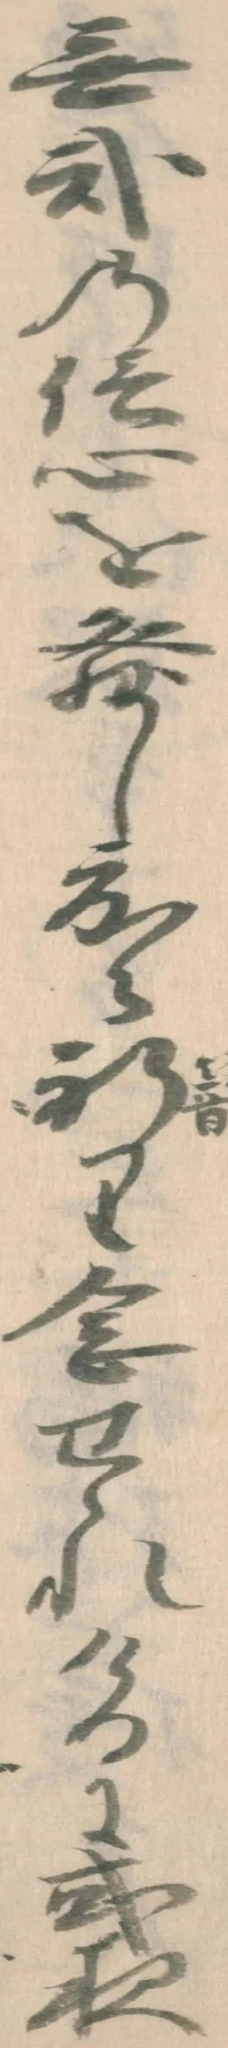無弐の信心を発し度々祈り念せられけるに或夜
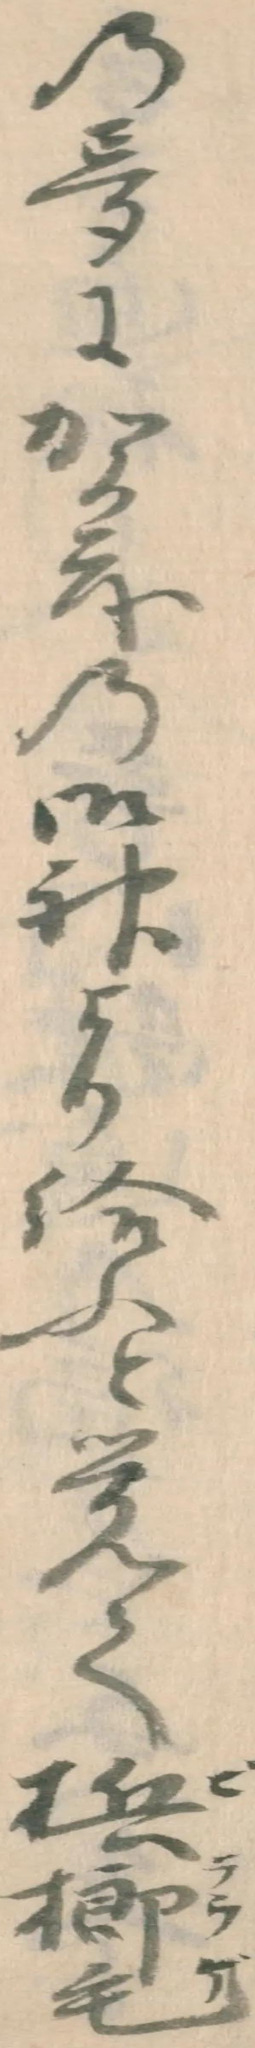の夢に賀茂の御神より給ふと覚て梹榔毛
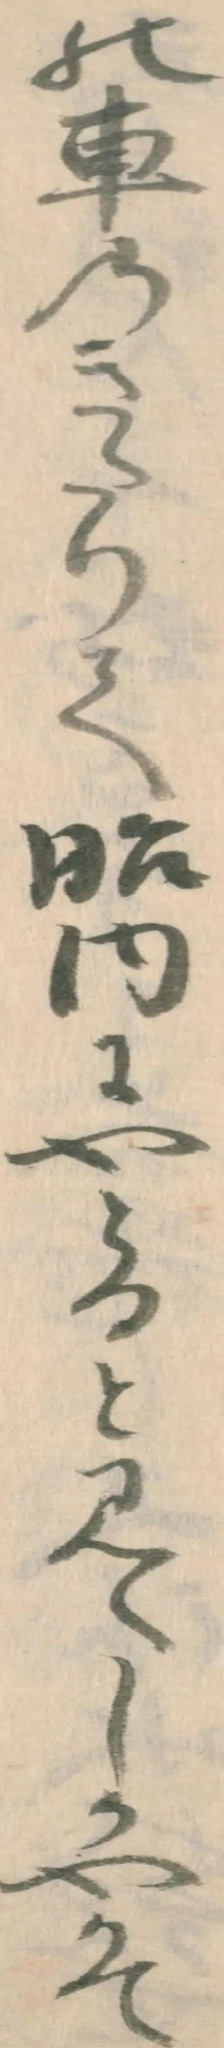の車のきたりて胎内にやとると見えしかやかて
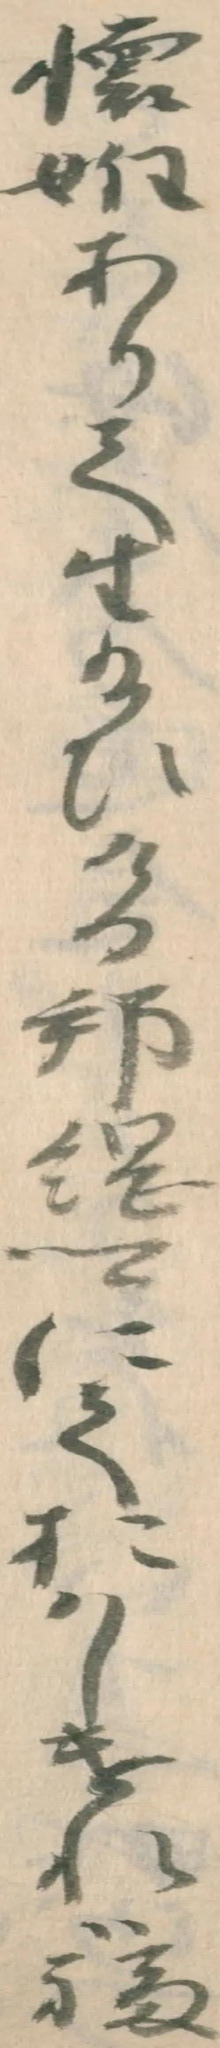懐妊ありて生給ひける邦綱卿にておはしけれは福
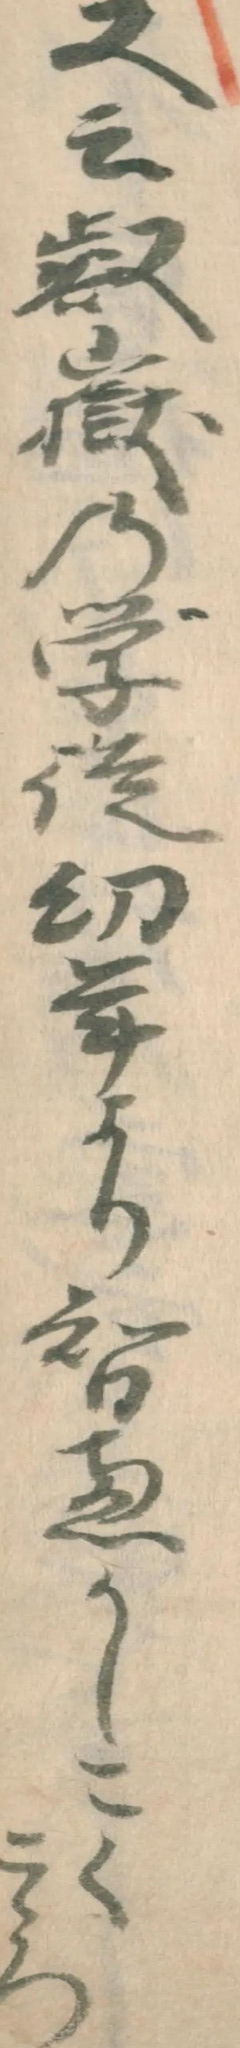又云叡嶽の学徒幼年より智恵かしこくこゝろ

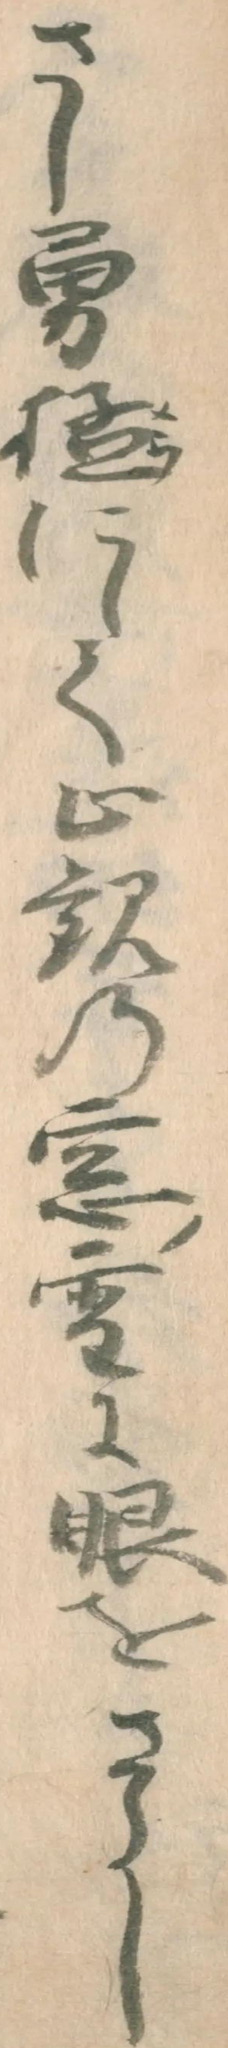さし勇猛にして止観の窓雪に眼をさらし
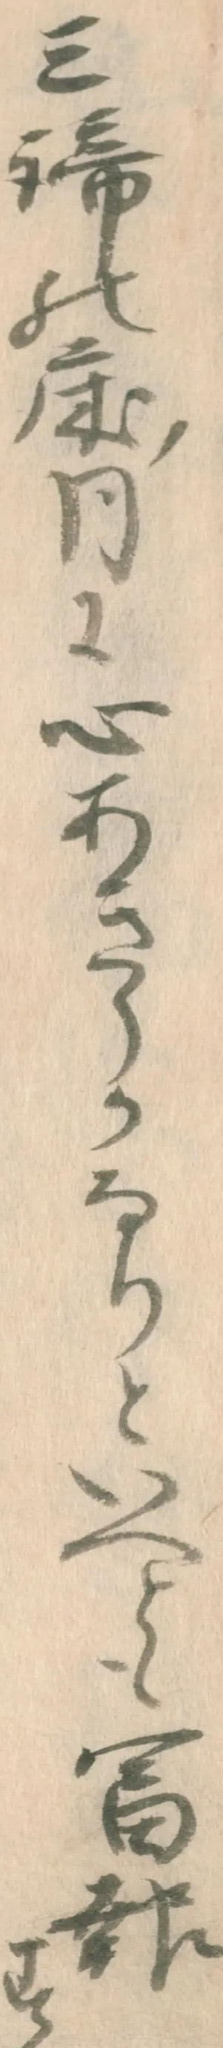三諦の床月に心あきらかなりといへとも冨報すく
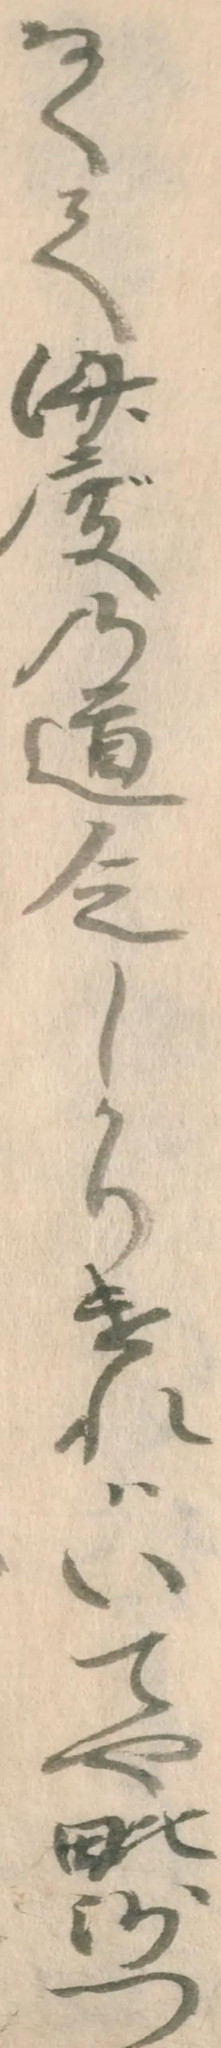なくて済度の道乏しかりけれはいてや毘沙門
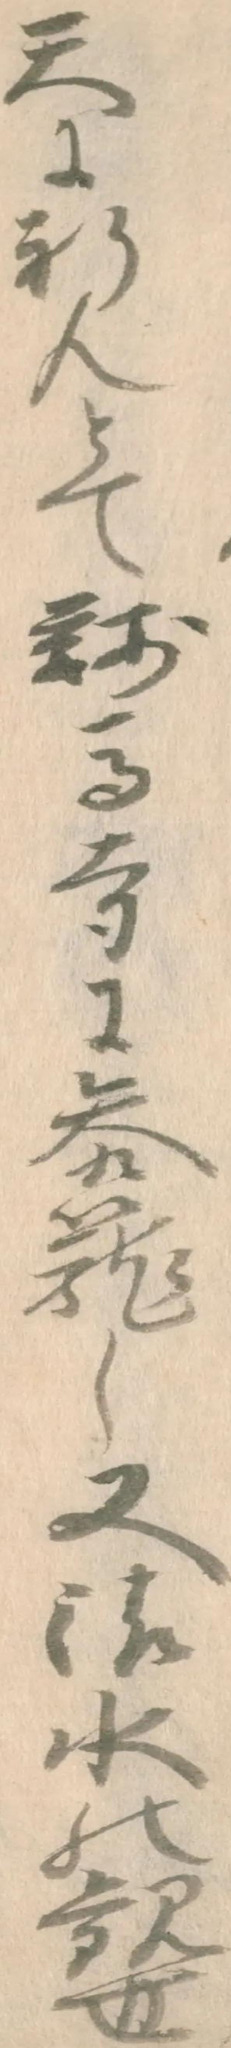天に祈んとて鞍馬寺に参籠し又清水の観世
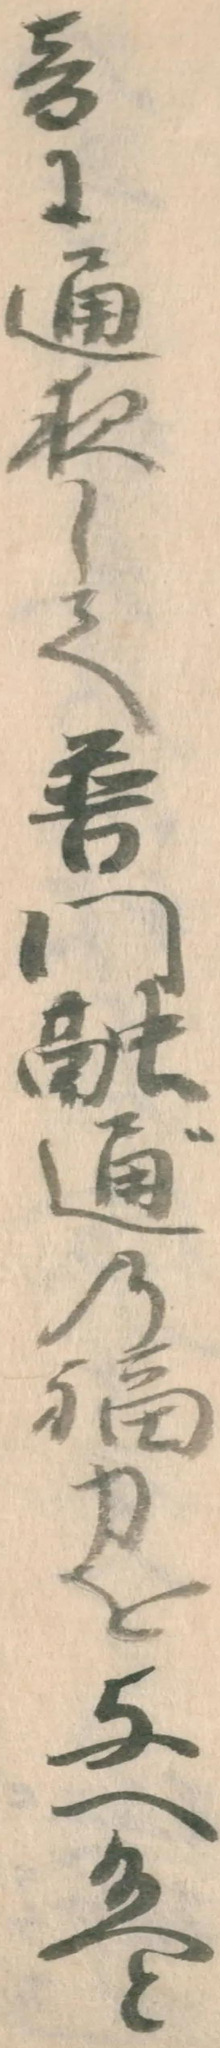音に通夜して普門融通の福力を与へ給へと
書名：賀茂社記録. 第1冊
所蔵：国立国会図書館 National Diet Library, JAPAN
